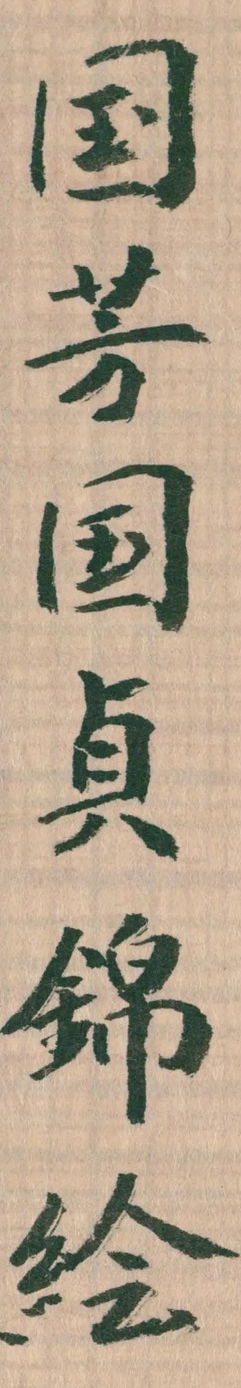国芳国貞錦絵

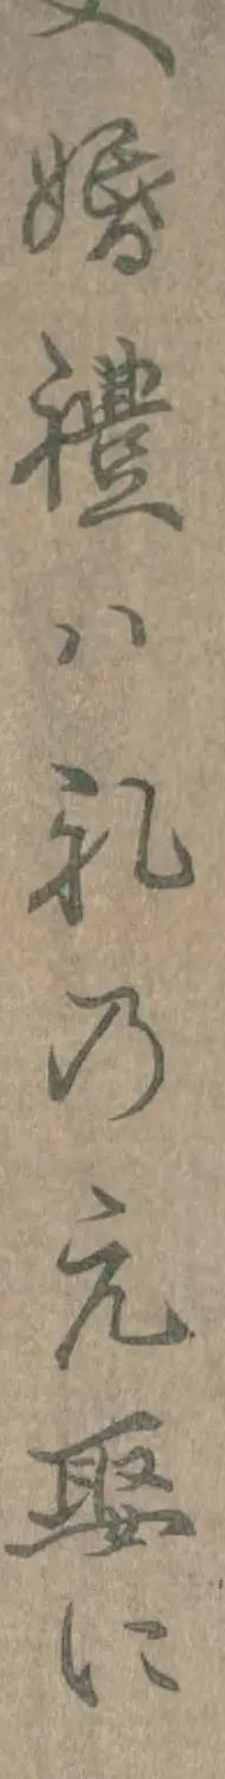婚礼は礼の元娶に
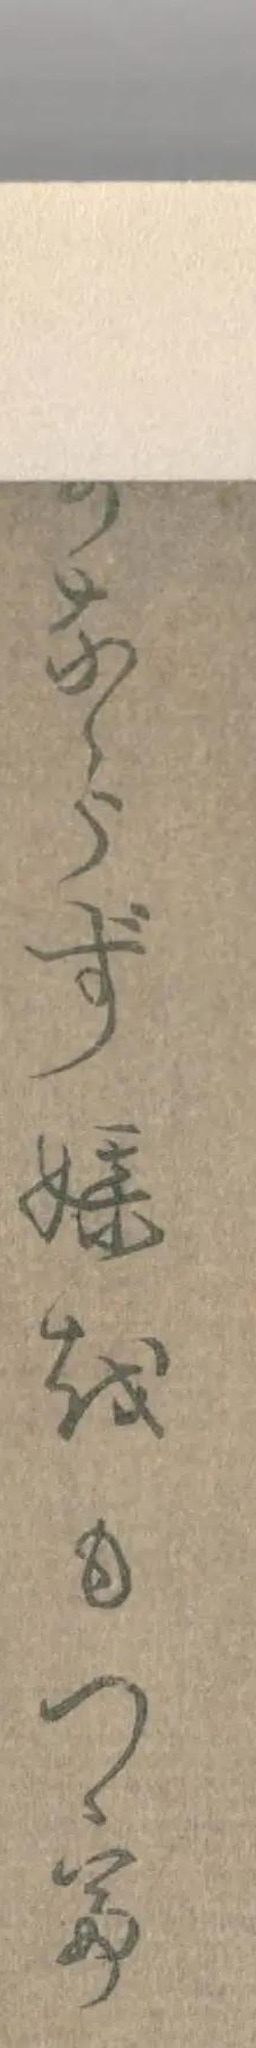かならず媒をもつて
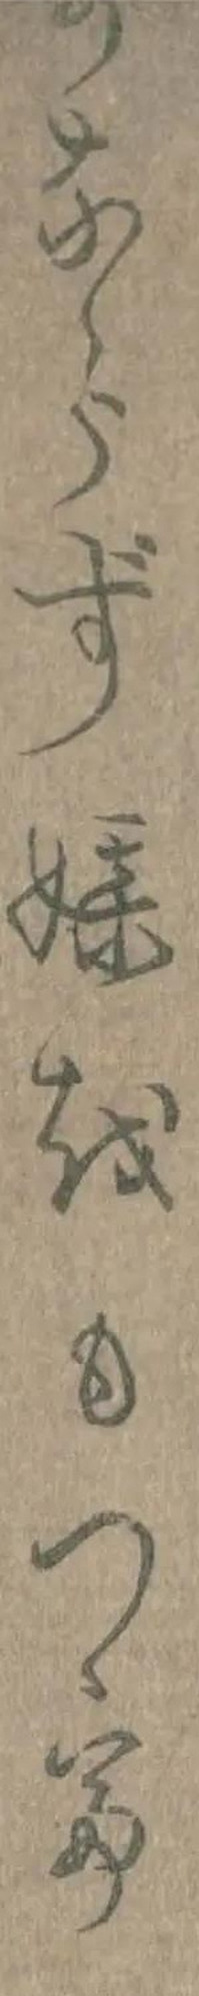かならず媒をもつて
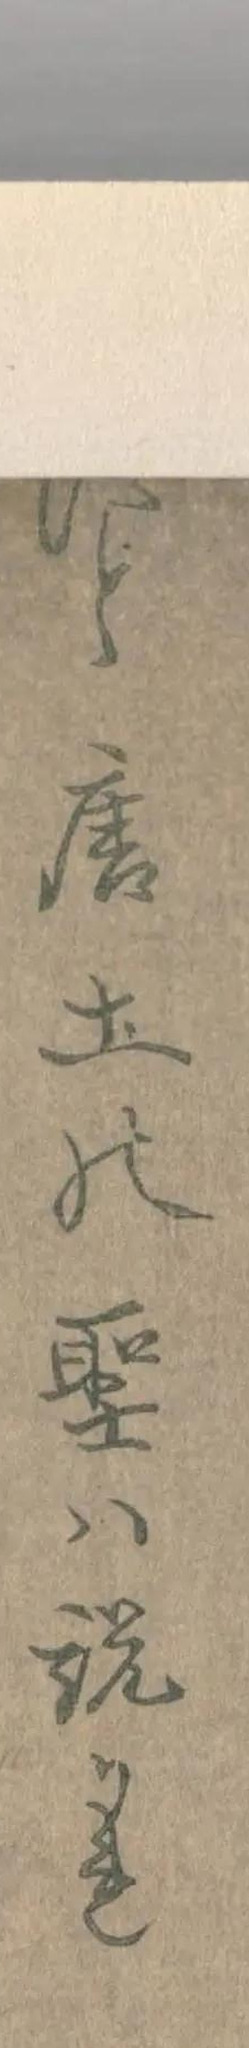すと唐土の聖は説かれ
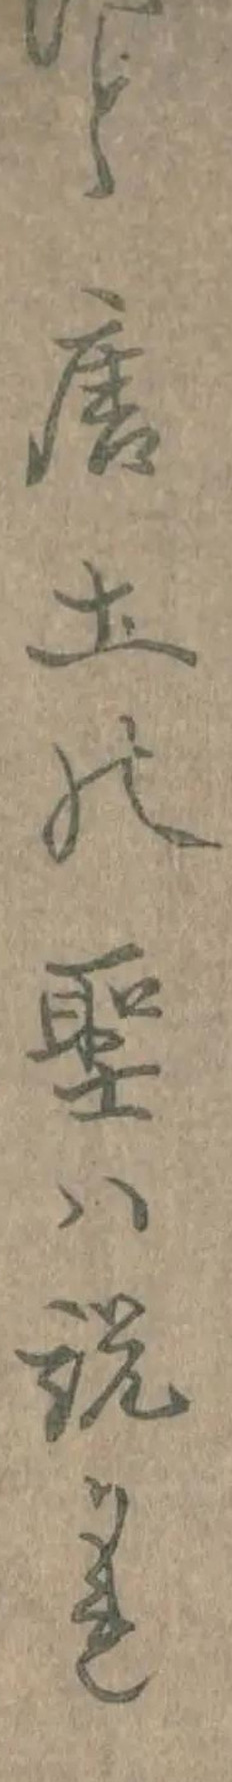すと唐土の聖は説かれ
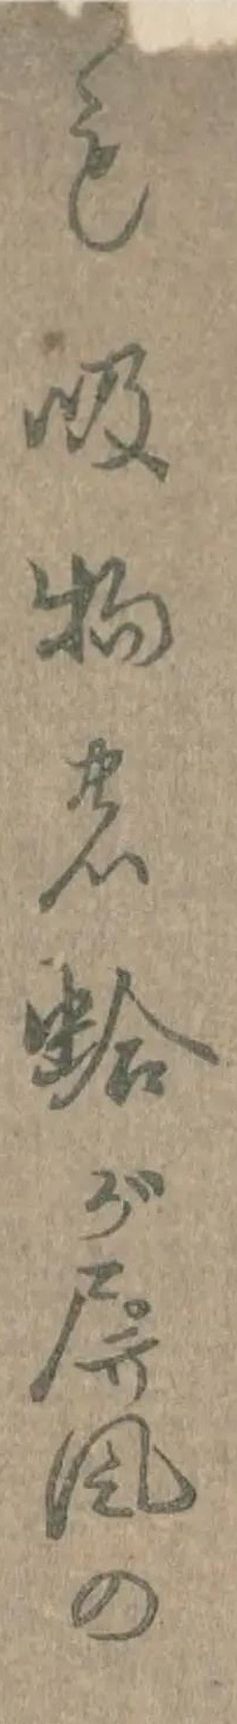も吸物の蛤が屏風の
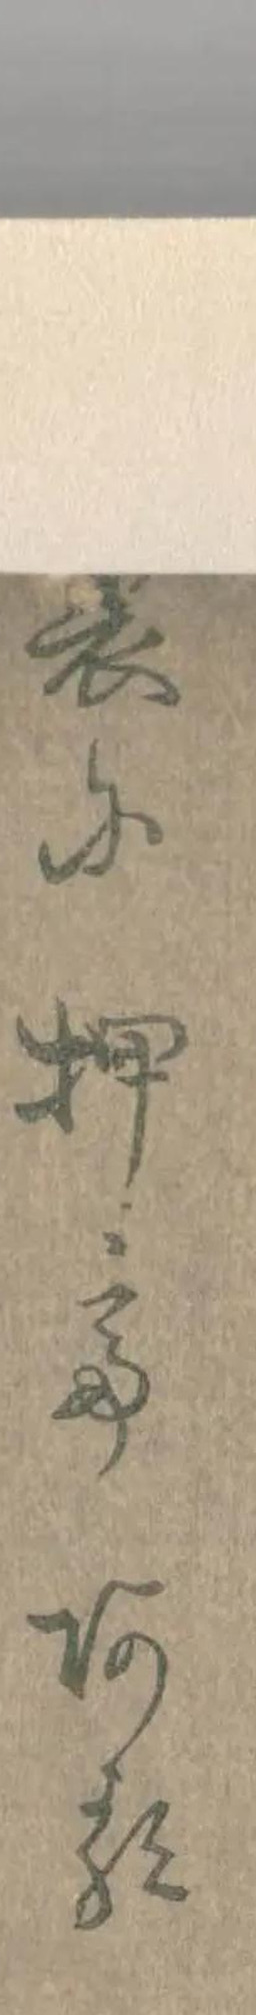裏に押てある
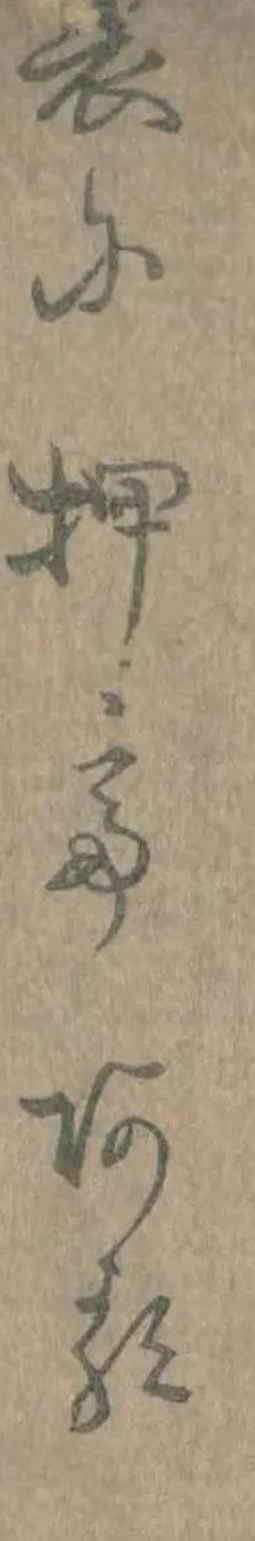裏に押てある
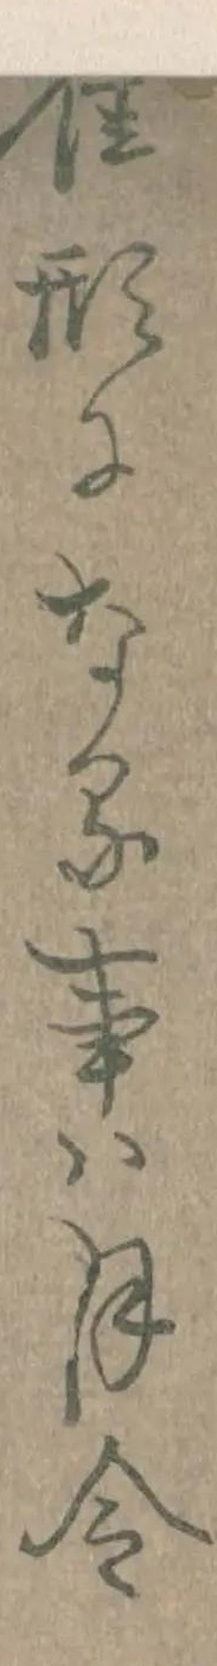形になる事は月令
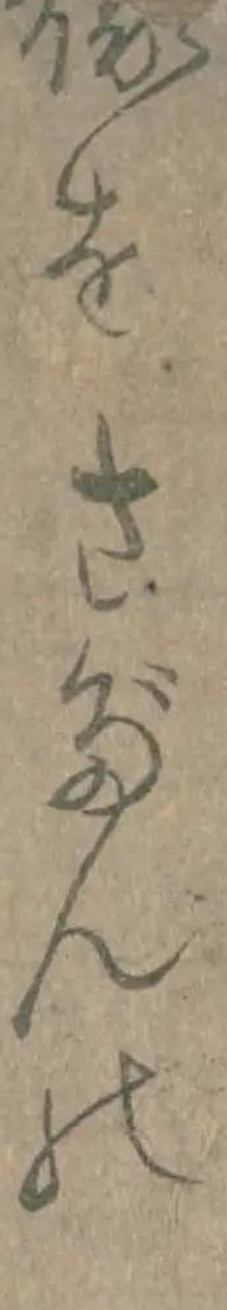をさだんの
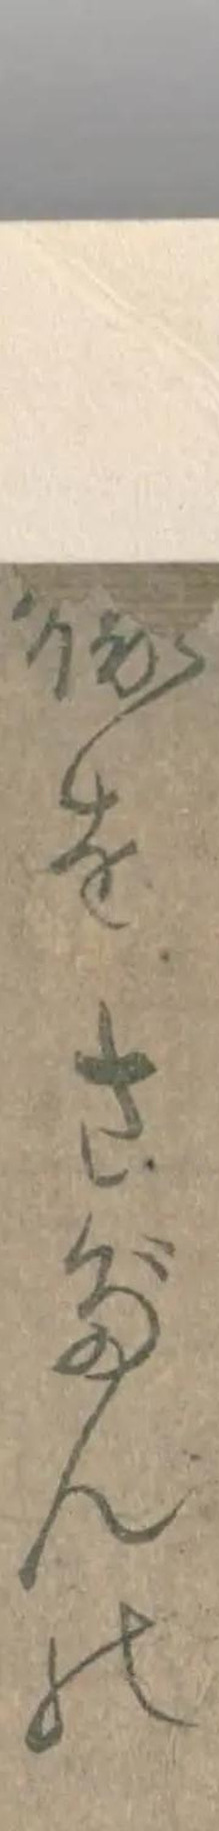をさだんの
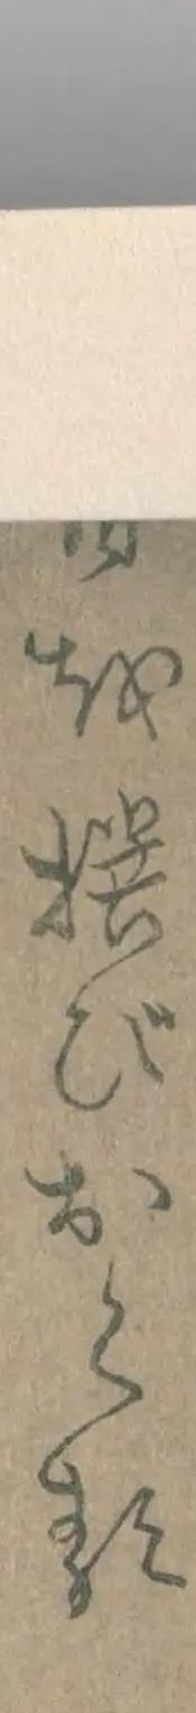を撰びおくる

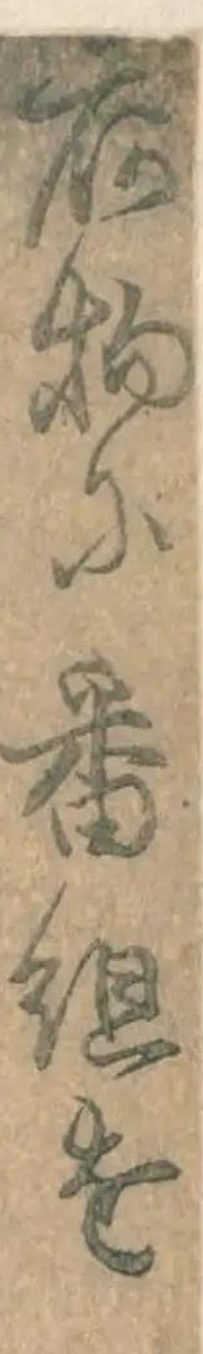荷物に番組を
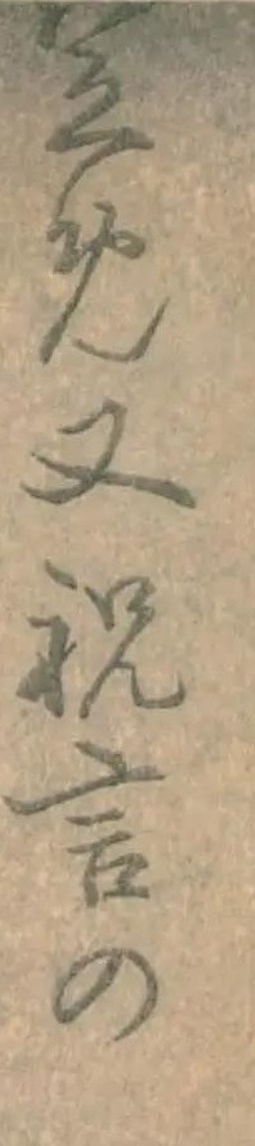め又祝言の
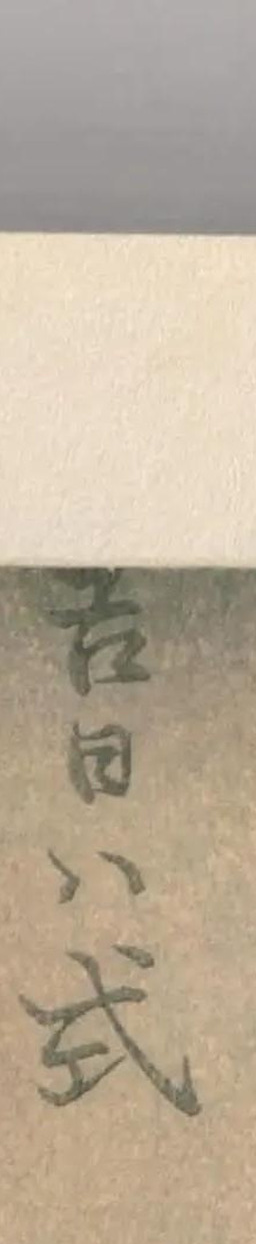吉日は式
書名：国芳国貞錦絵
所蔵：国立国会図書館 National Diet Library, JAPAN
